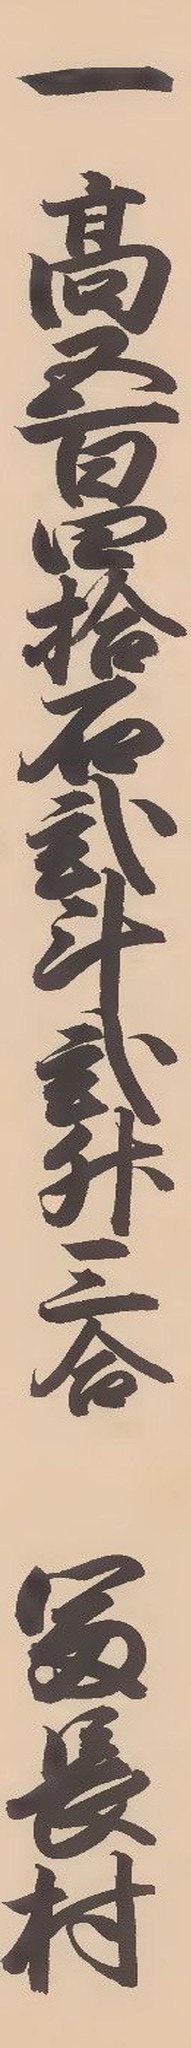一高五百四拾石弐斗弐升三合富長村
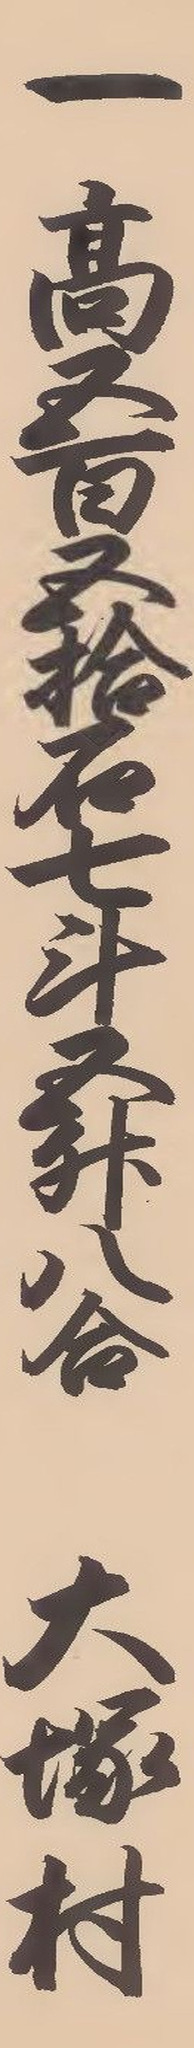一高五百五拾石七斗五升八合大塚村
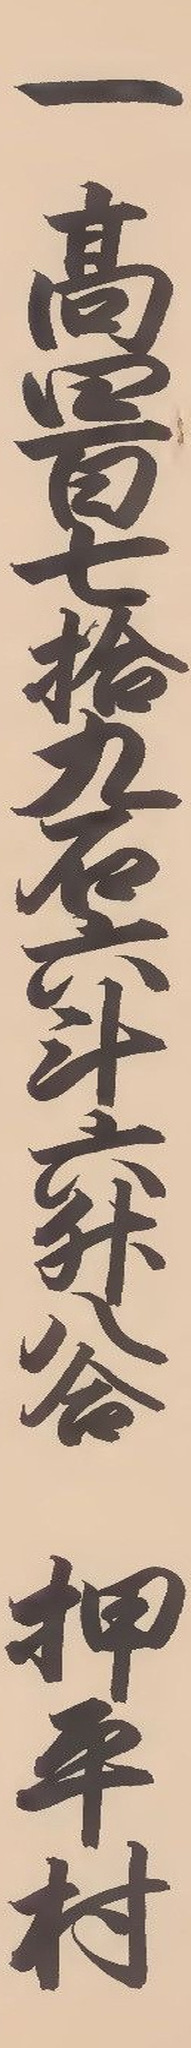一高四百七拾九石六斗六升八合押平村
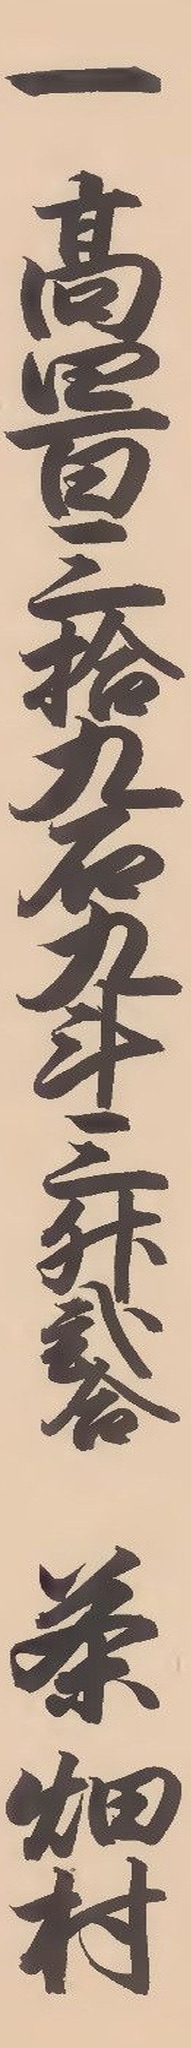一高四百三拾九石九斗三升弐合茶畑村
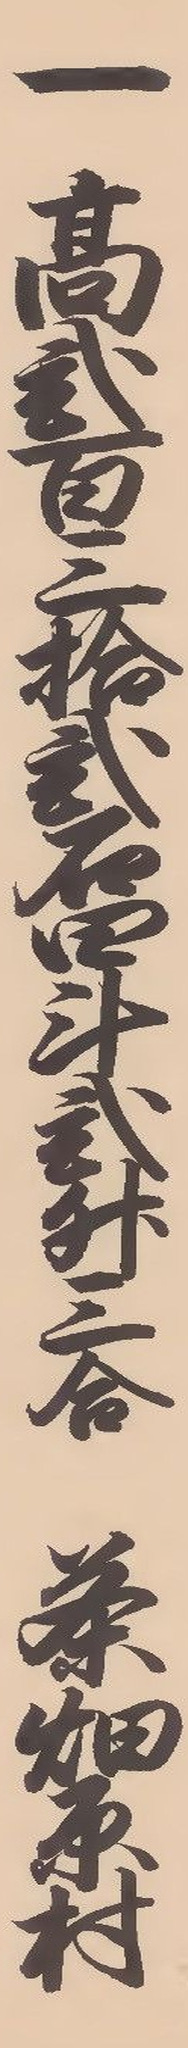一高弐百三拾弐石四斗弐升三合茶畑原村
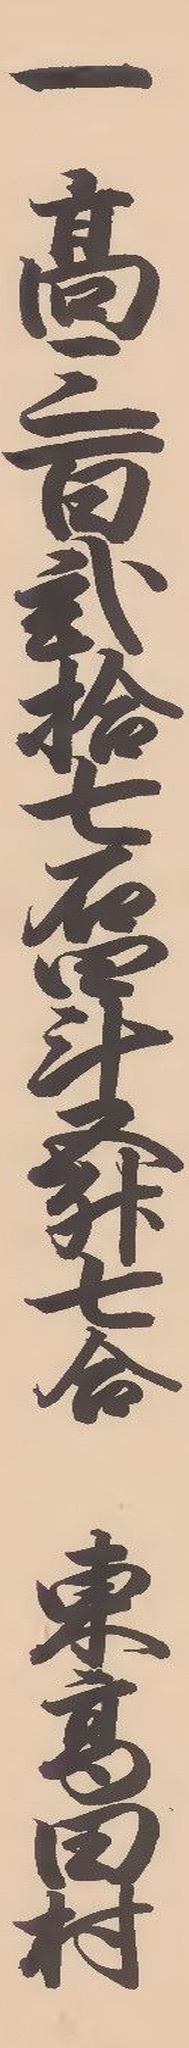一高三百弐拾七石四斗五升七合東高田村

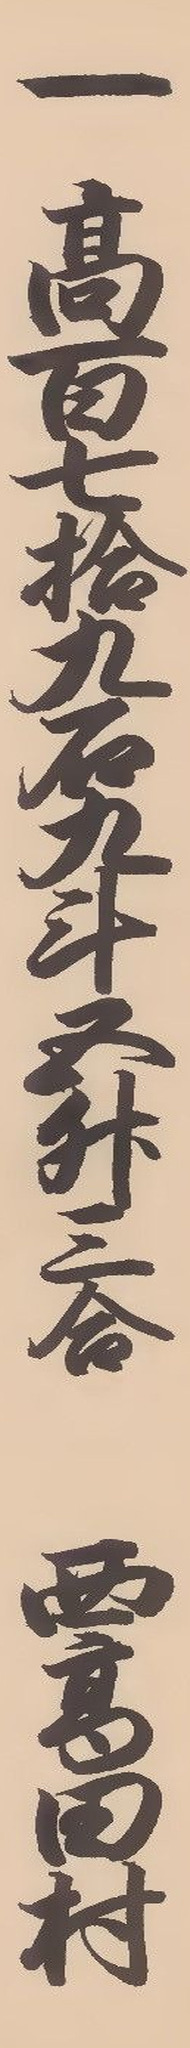一高百七拾九石九斗五升三合西高田村
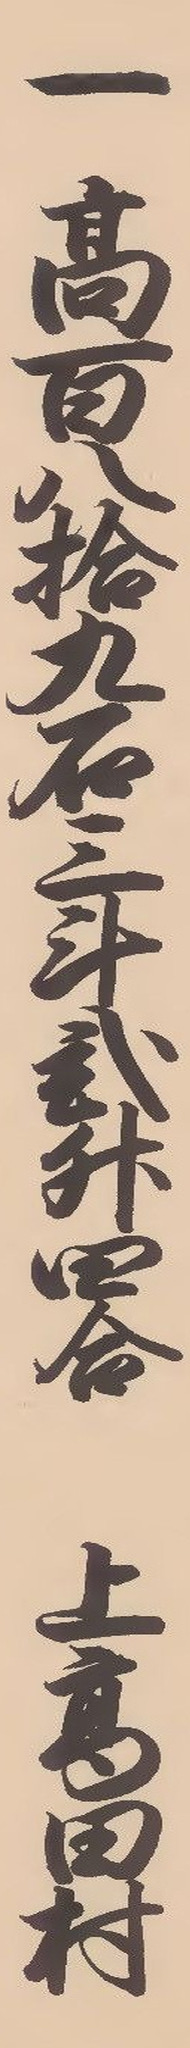一高百八拾九石三斗弐升四合上高田村
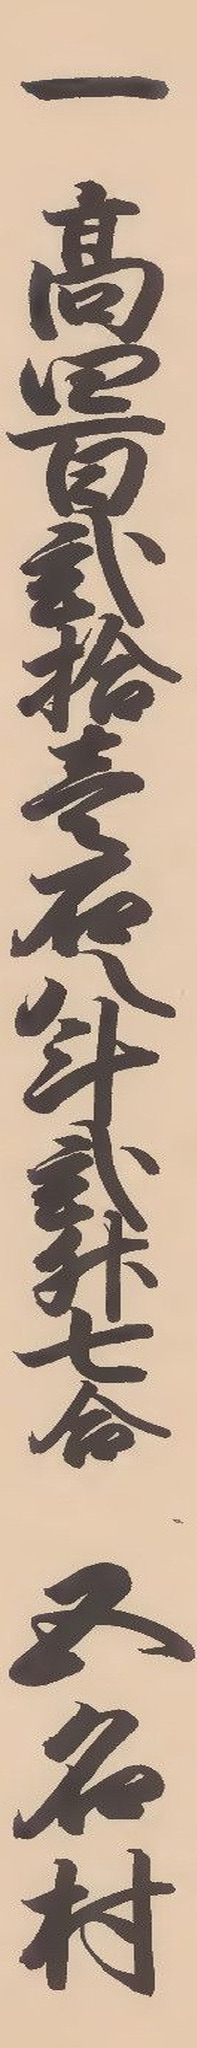一高四百弐拾壱石八斗弐升七合五名村
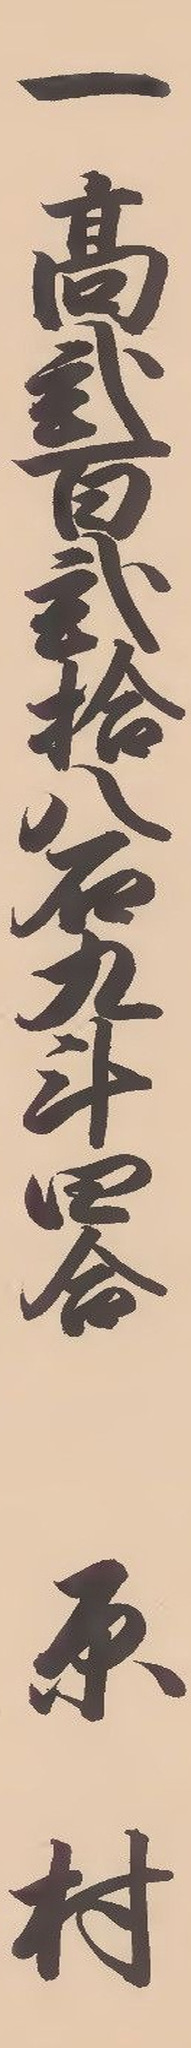一高弐百弐拾八石九斗四合原村
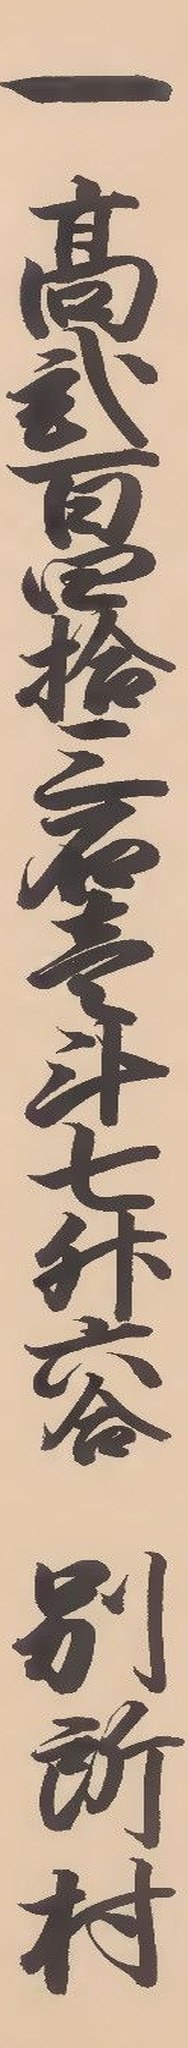一高弐百四拾三石壱斗七升六合別所村
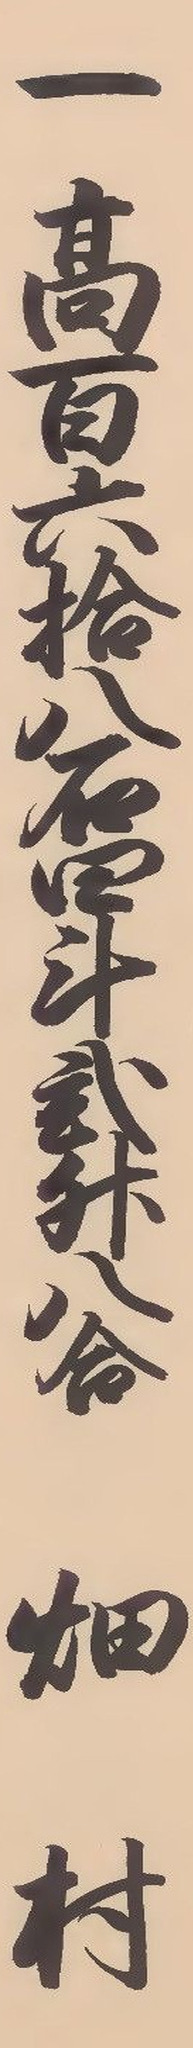一高百六拾八石四斗弐升八合畑村
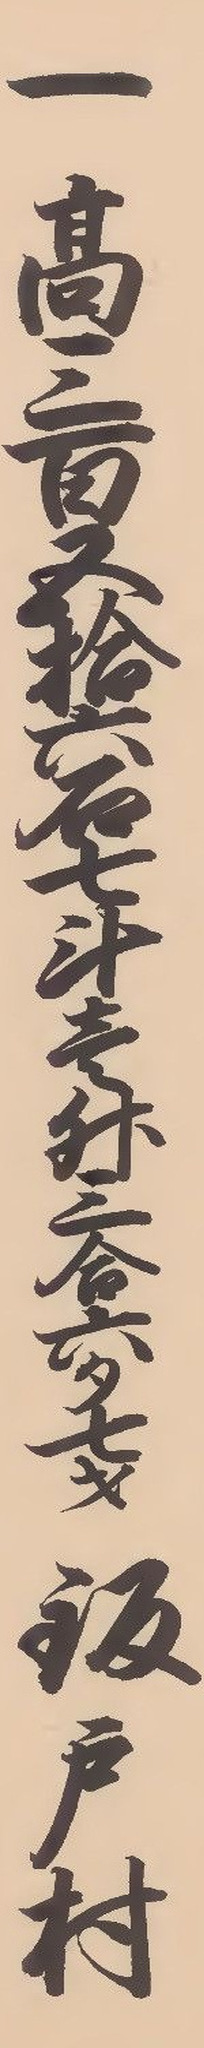一高三百五拾六石七斗壱升三合六勺七才鈑戸村
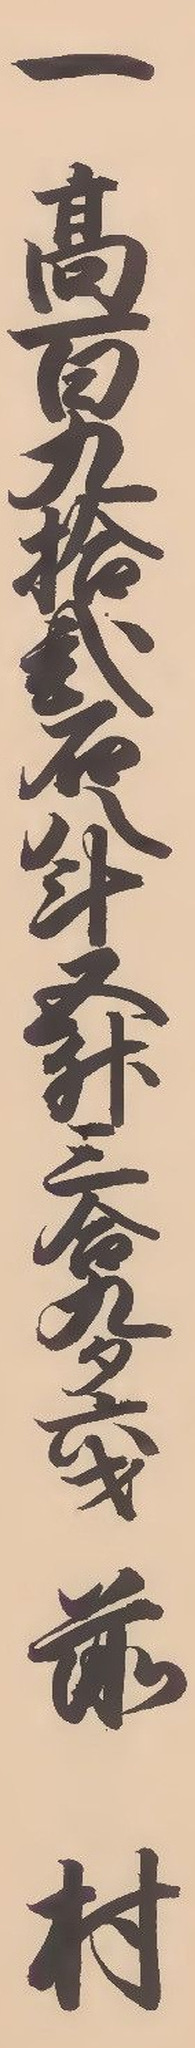一高百九拾弐石八斗五升三合九タ六才前村

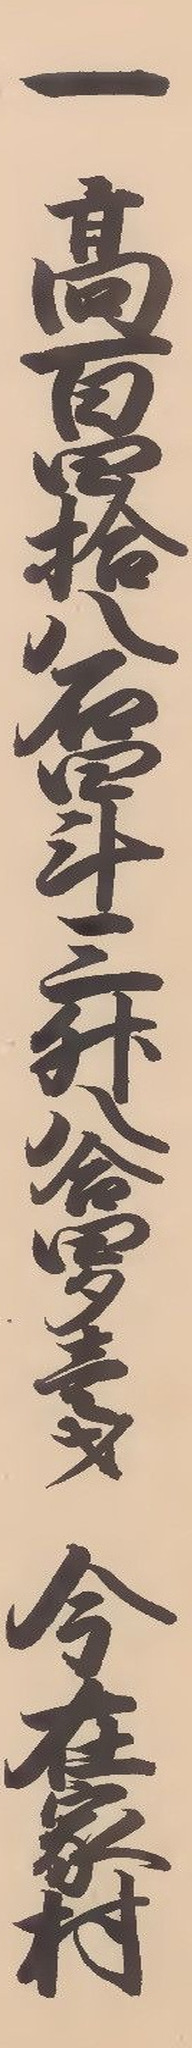一高百四拾八石四斗三升八合四勺壱才今在家村
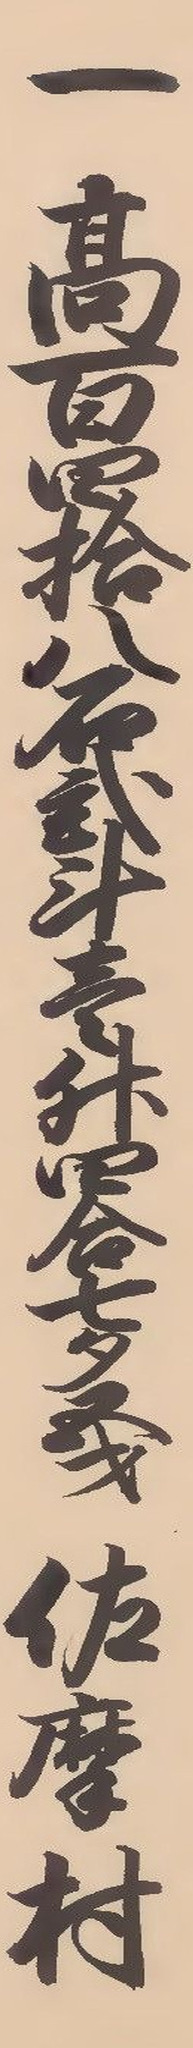一高百四拾八石弐斗壱升四合七勺五才佐摩村
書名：伯耆国郷帳
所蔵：国立公文書館 National Archives of Japan
